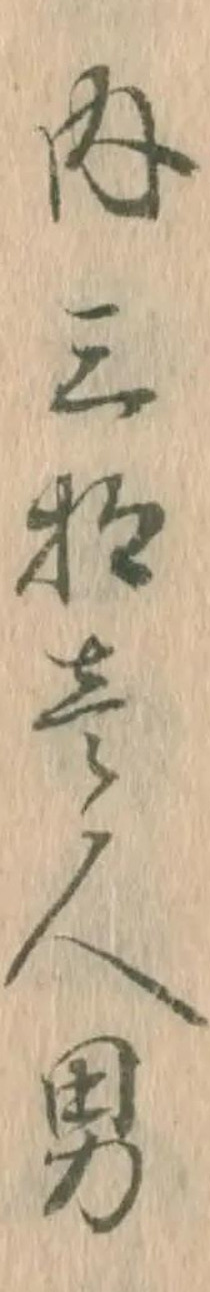内三拾壱人男
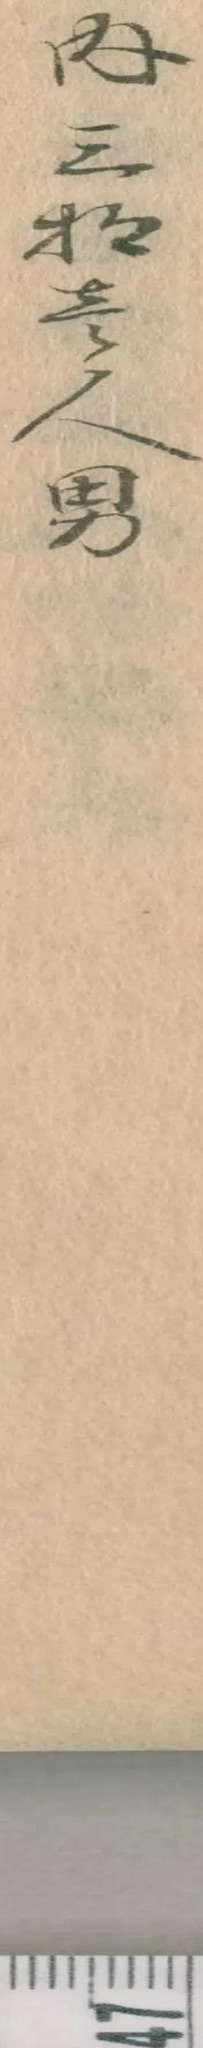内三拾壱人男
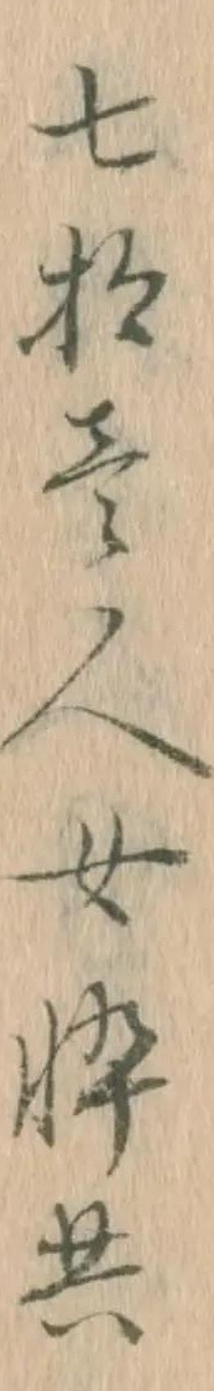七拾壱人女忰共
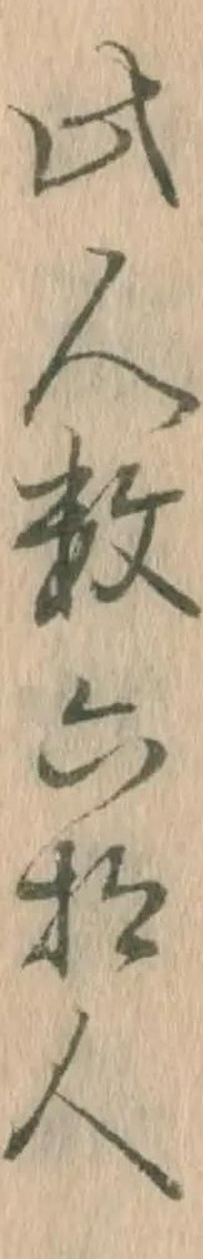此人数六拾人
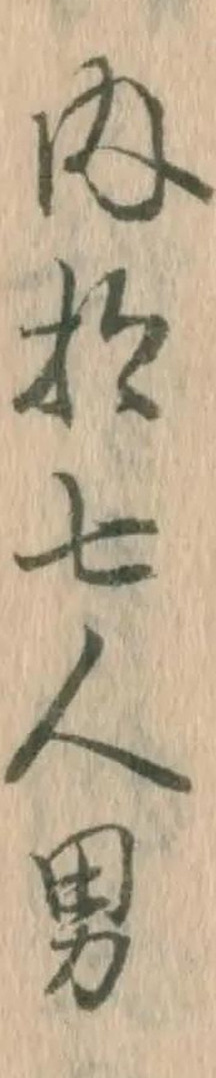内拾七人男
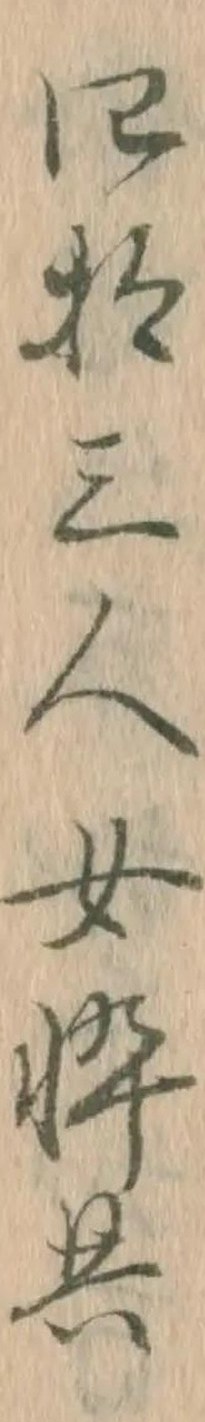四拾三人女忰共
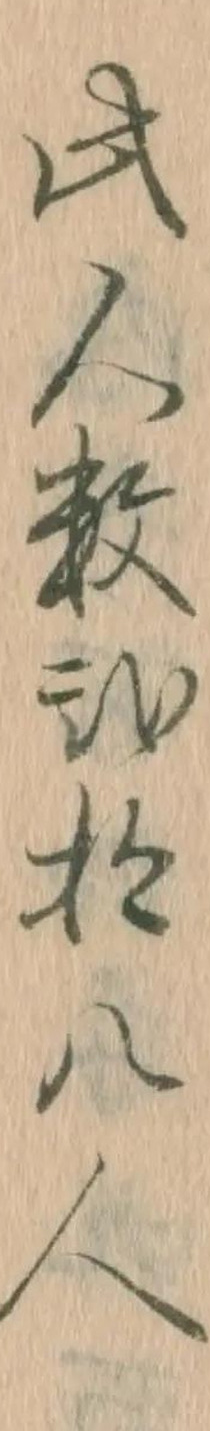此人数弐拾八人
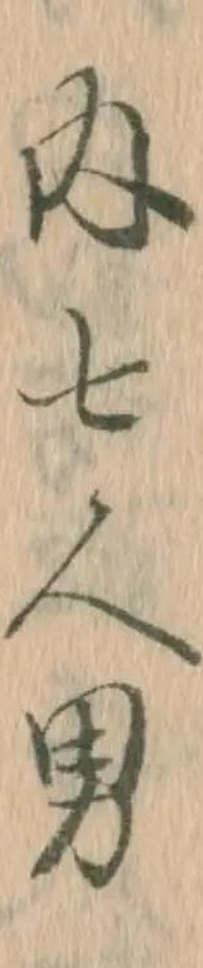内七人男
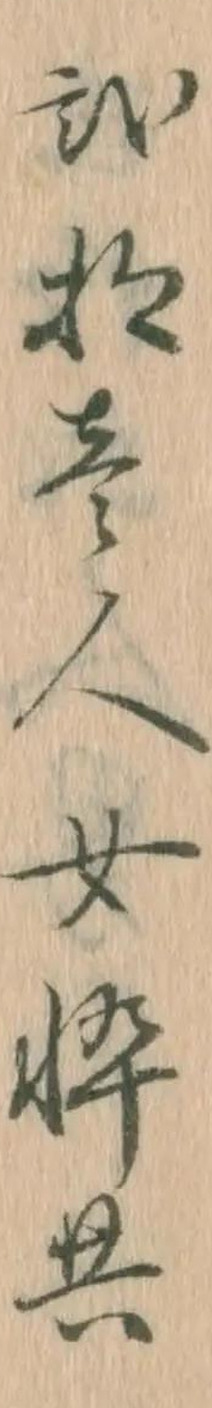弐拾壱人女忰共
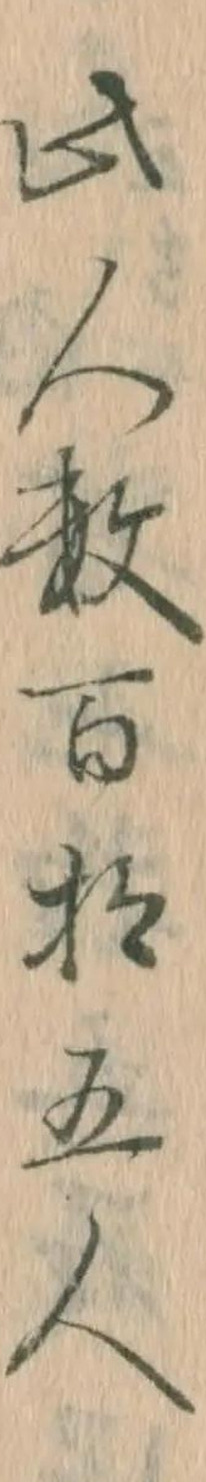此人数百拾五人
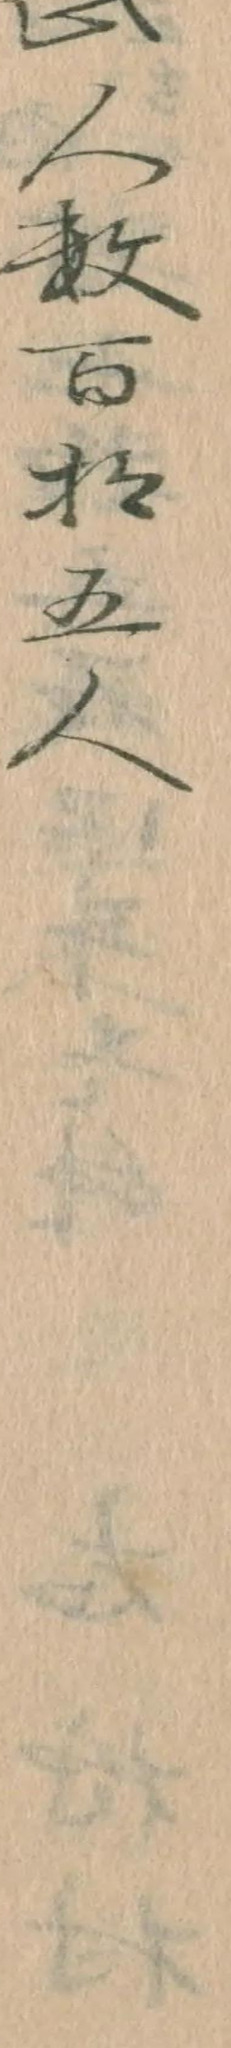此人数百拾五人
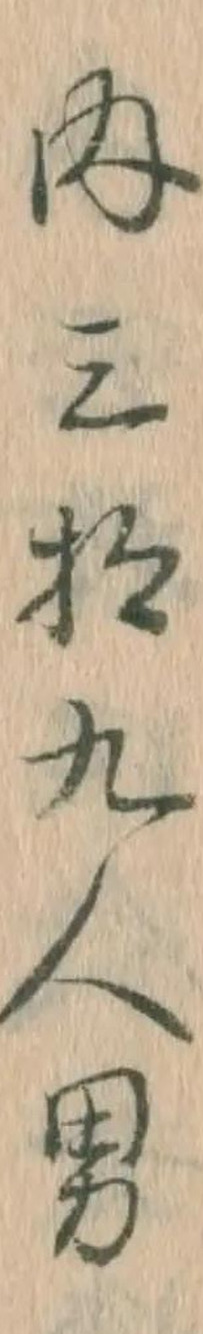内三拾九人男
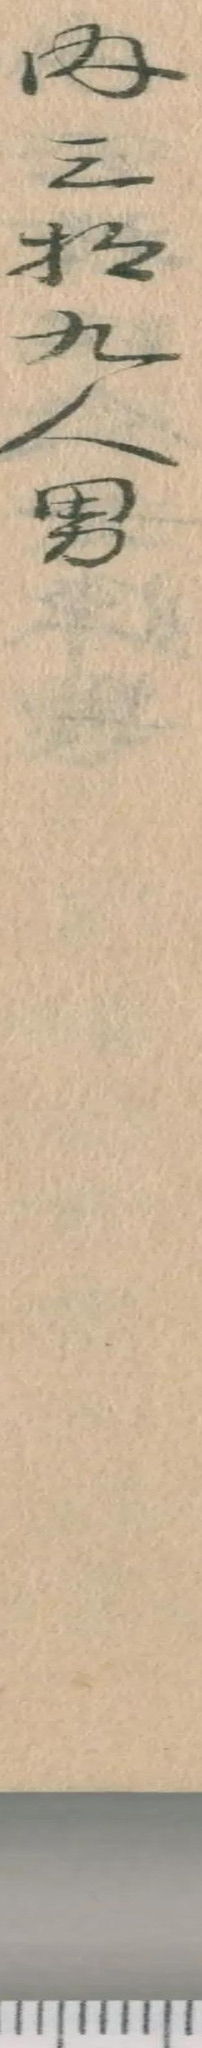内三拾九人男
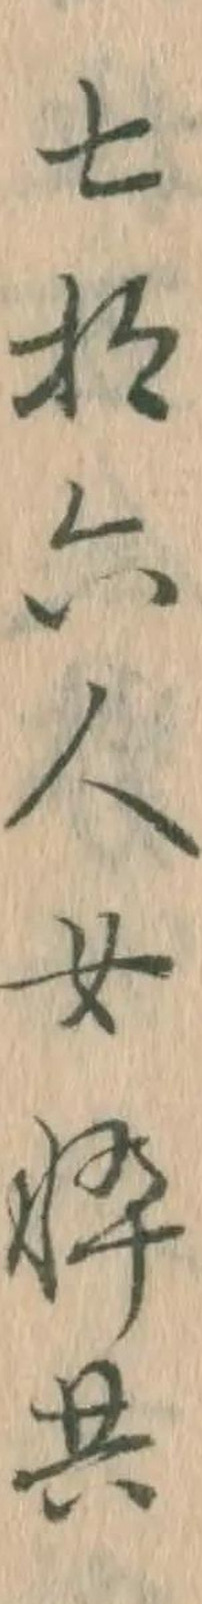七拾六人女忰共
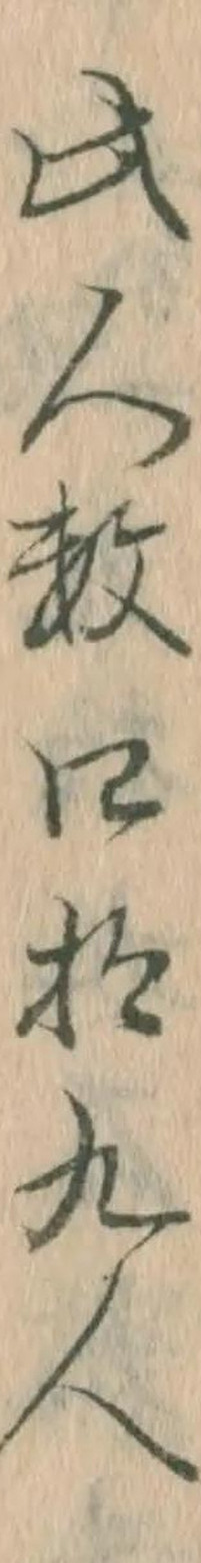此人数四拾九人
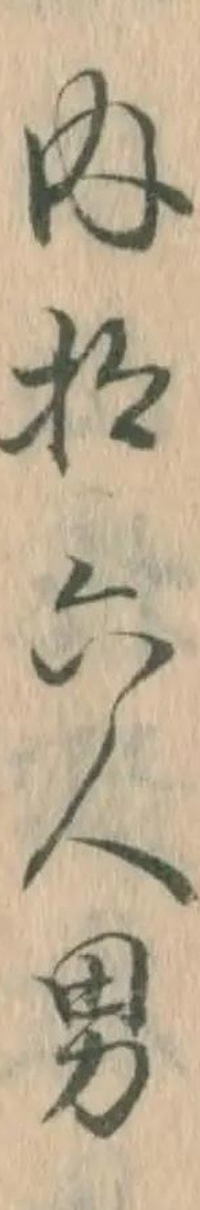内拾六人男
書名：切支丹御退治記 49巻. [2]
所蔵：国立国会図書館 National Diet Library, JAPAN
